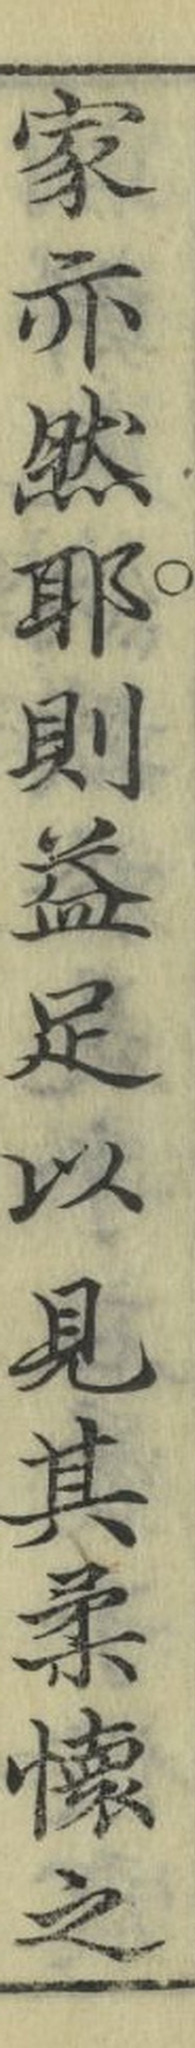家亦然耶。則益足以見其柔懐之
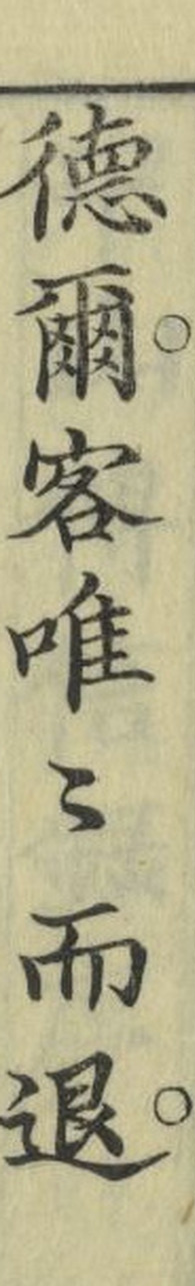德爾。客唯々而退。
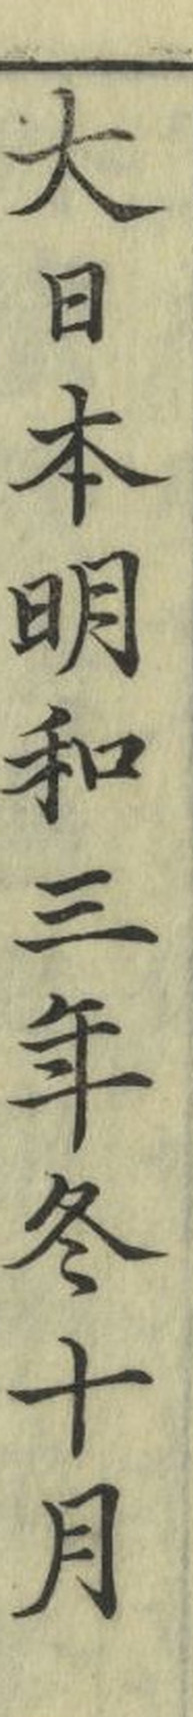大日本明和三年冬十月
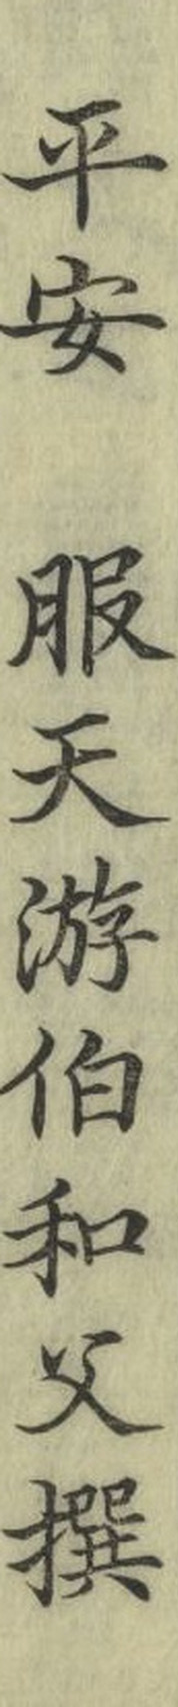平安服天游伯和文撰

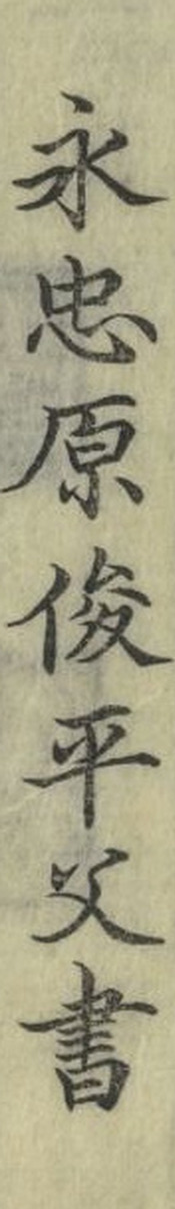永忠原俊平文書
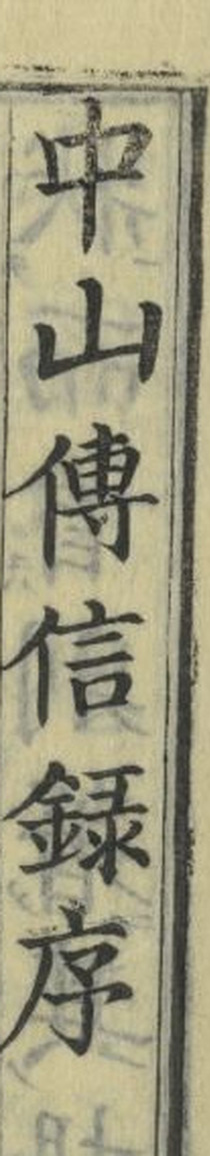中山傳信錄序

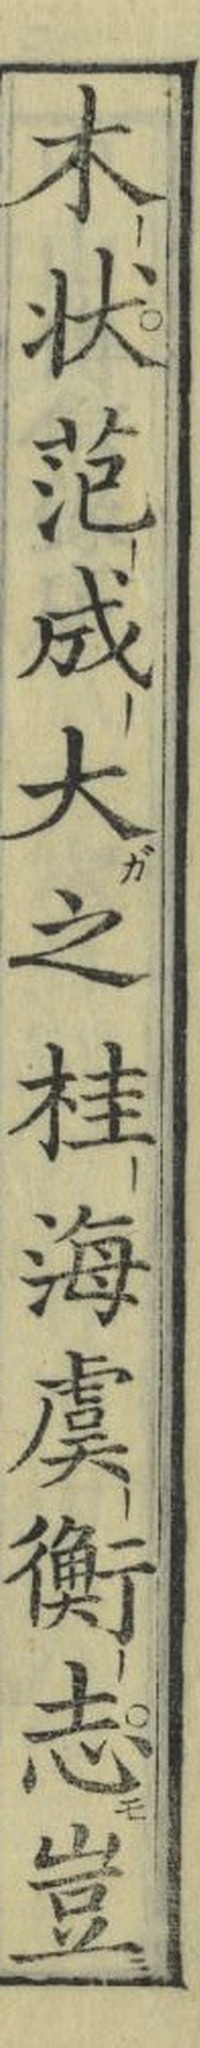木-状。范-成-大之桂-海虞-衡-志。豈
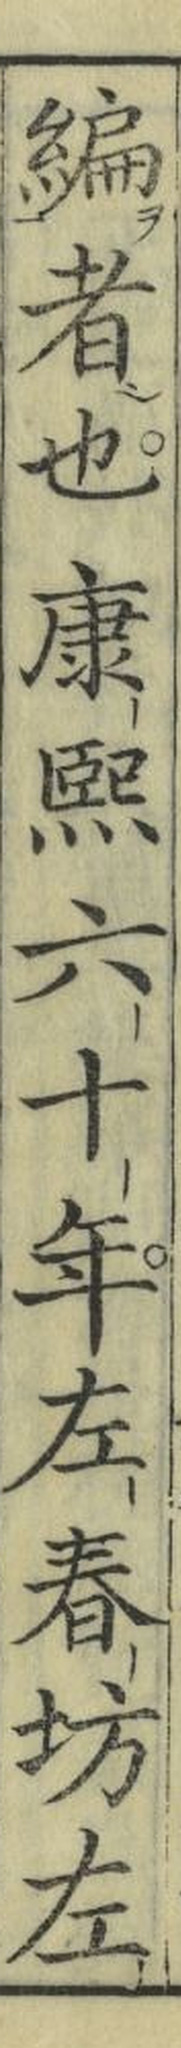編者也。康-熙六-十-年。左-春-坊左-
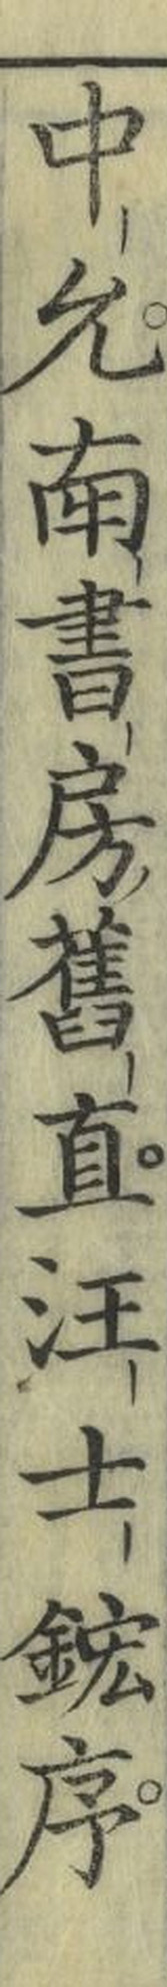中-允。南-書-房舊-直。汪-士-鋐序。

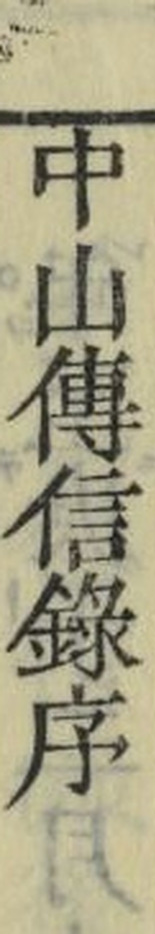中山傳信錄序

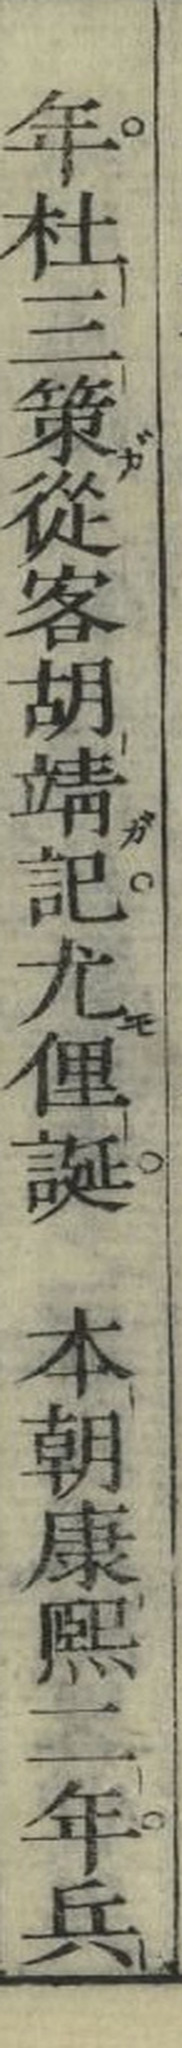年。杜-三策從-客胡-靖記。尤俚-誕。本-朝康-煕二-年。兵-
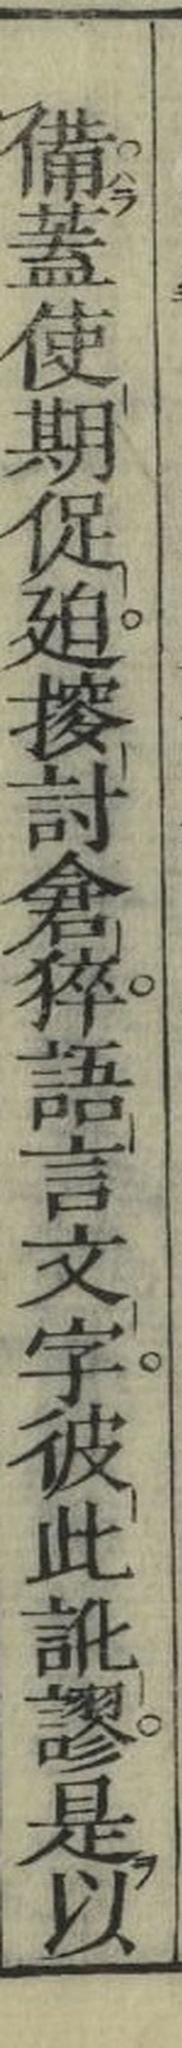備。蓋使-期促-廹。摉-討倉-猝。語-言文-字。彼-此訛-謬。是以
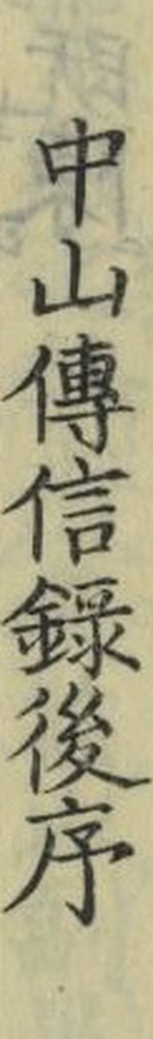中山傳信録後序

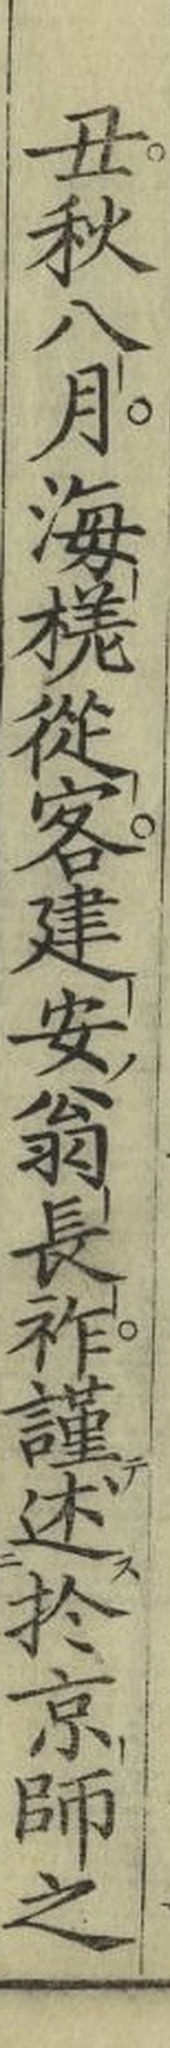丑。秋八-月。海-槎從-客。建-安翁-長-祚。謹述扵京-師之

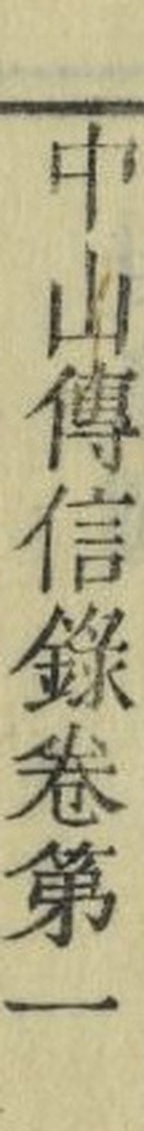中山傳信錄卷第一
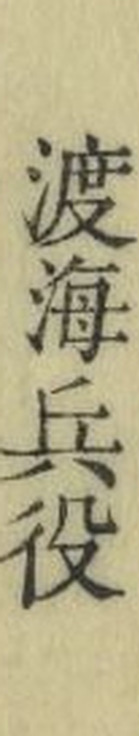渡海兵役
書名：中山伝信録 巻一
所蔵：University of the Ryukyus Library
